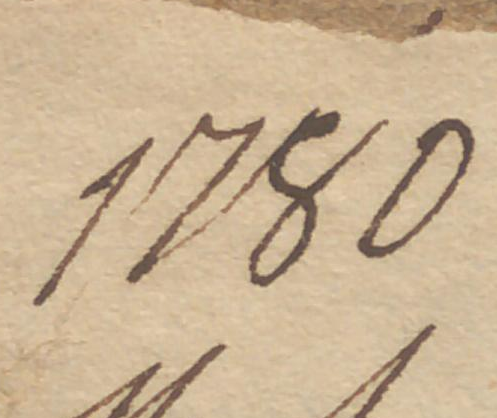1780
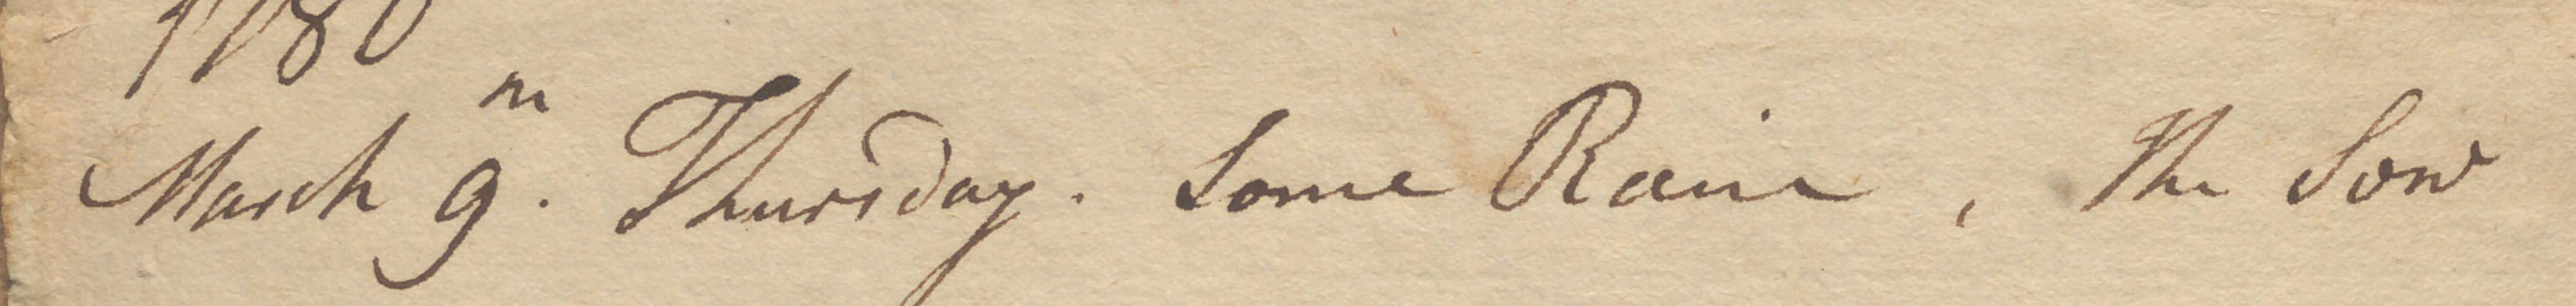March 9^th. Thursday. Some Rain, the Sow
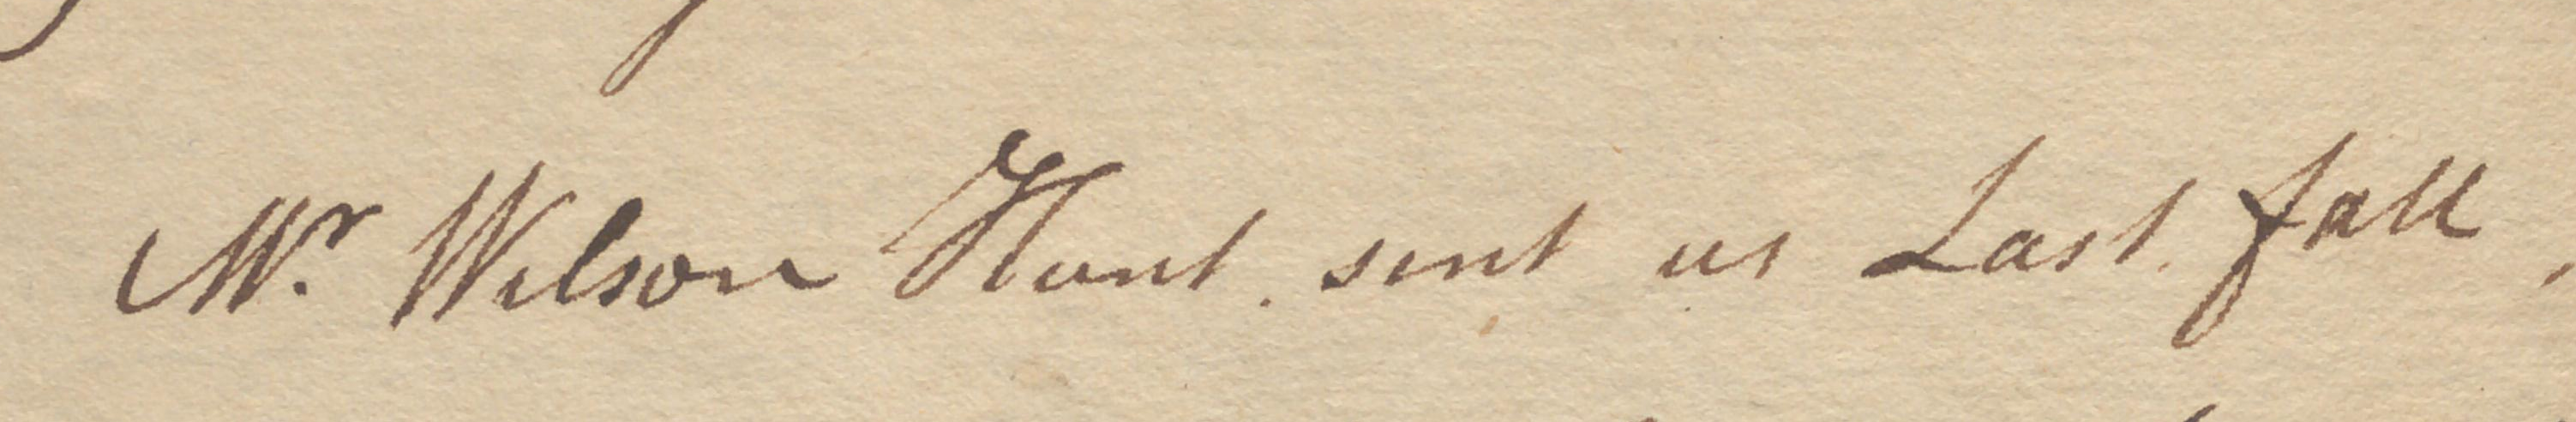M^r. Wilson Hunt sent us Last fall
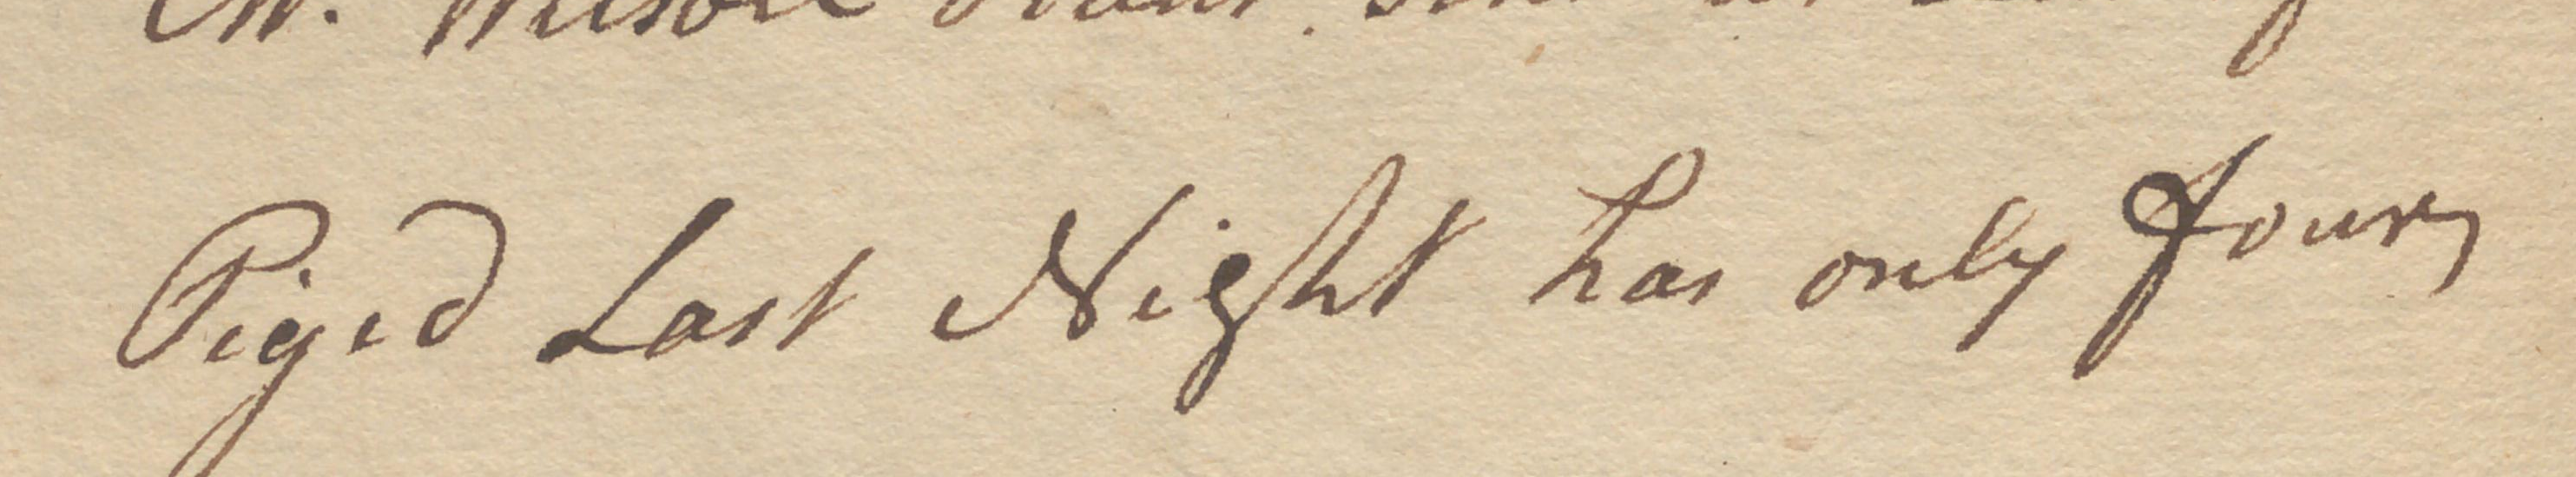Piged Last Night has only four
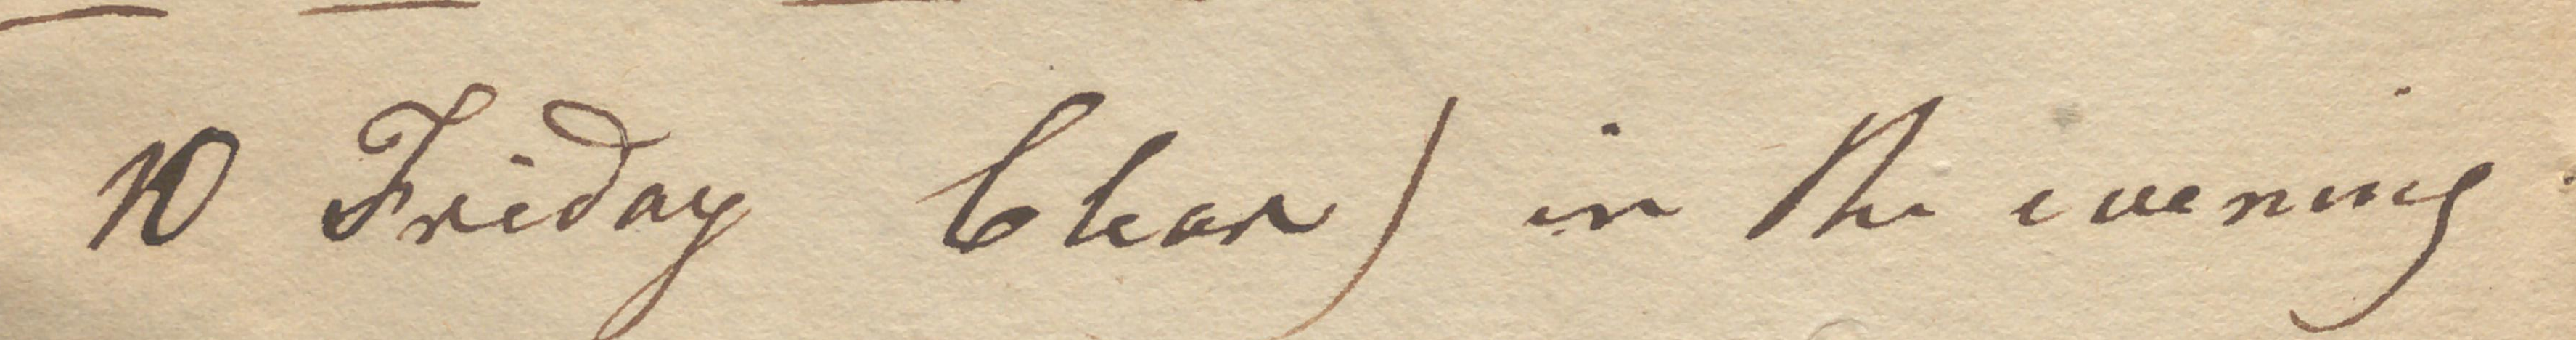10 Friday Clear) in the evening
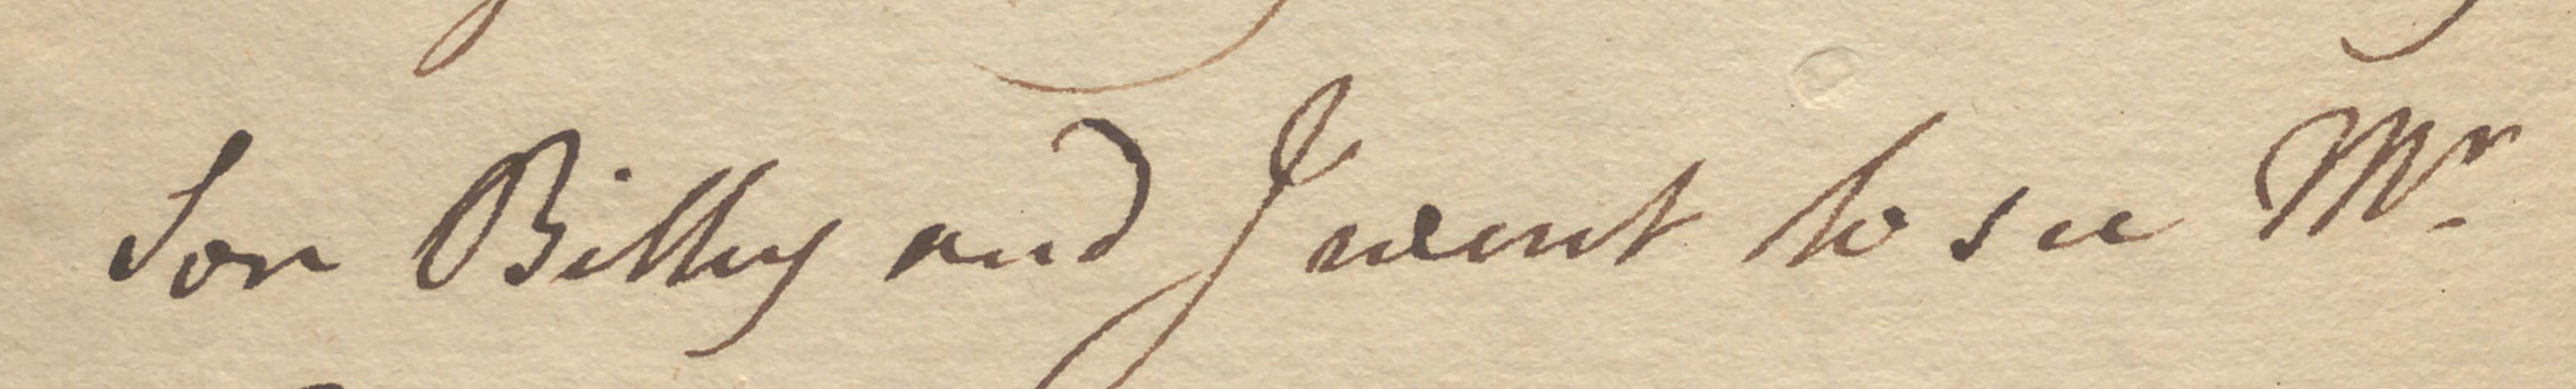Son Billey and I went to see M^r.
